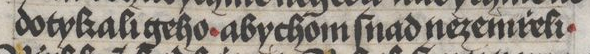dotykali geho.abychom ſnad nezemṙeli.
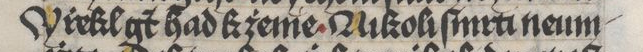Y ṙekl ḡt had k żeníe.Nikoli ſmrti neum¬
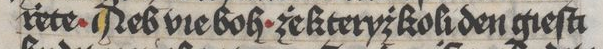ṙete.Neb vie boh.że kteryżkoli den gieſti
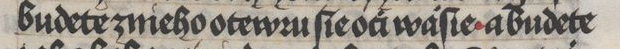budete znieho otewru ſie oċi waẛie.a budete
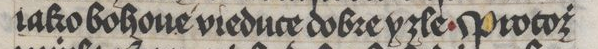iako bohoué vieduce dobre y zle.Protoż
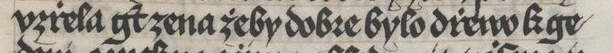vzṙela ḡt zena żeby dobre bylo dṙewo k ge¬
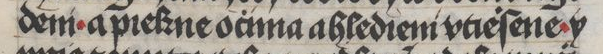dení. a piekne oċima a hlediení vtieẛene.y
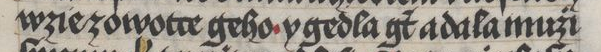wzíe z owotce geho.y gedla ḡt a dala mużi
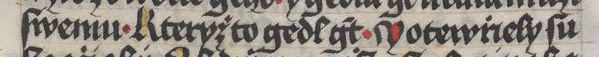ſwemu.Kteryž to gedl ḡt.Y otewṙiely ſu
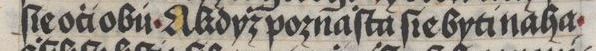ſie oċí obú.A kdyż poznaẛta ſie bytí naha.
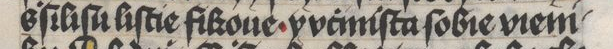sẛili ſu liſtie fikoue.y vċiniẛta ſobie viení¬
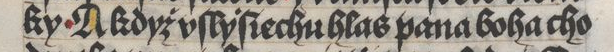ky.A kdyż vſlyẛíechu hlas pana boha cho¬
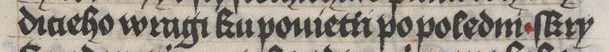dicieho wragi ku pouíetṙi popolední.ſkry¬
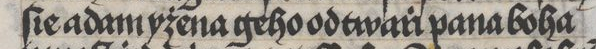ſie adam yżena geho odtwaṙi pana boha
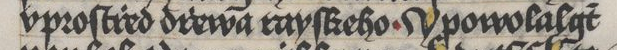vproſtṙed dṙewa rayſkeho.Y powolal ḡt
